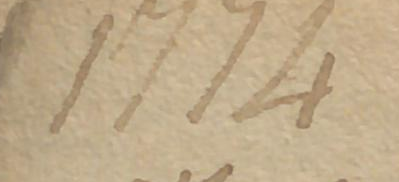1774
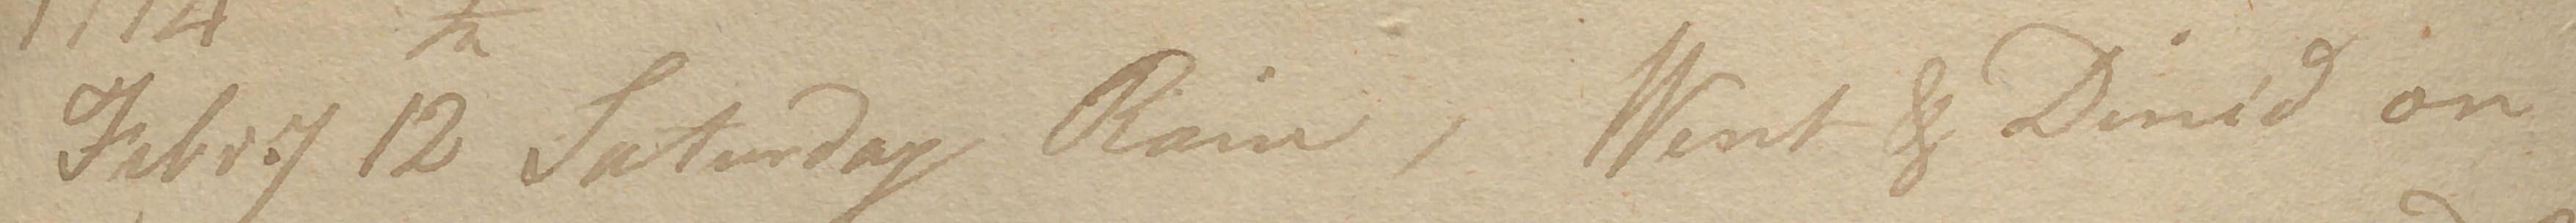Febr^y. 12^th Saturday Rain, Went & Dined on
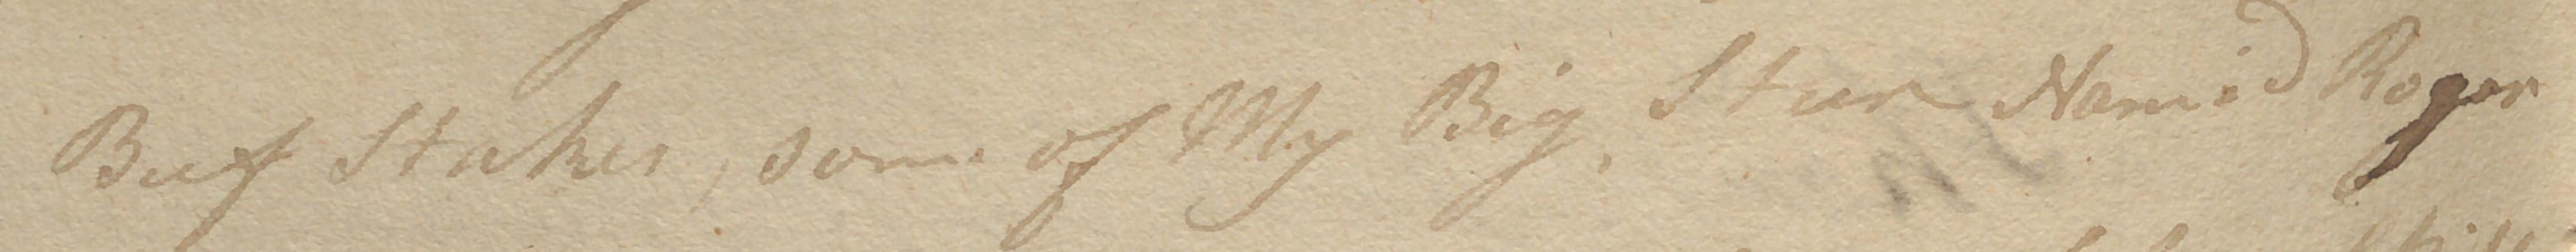Beef Stakes, some of My Big Steer Named Roger
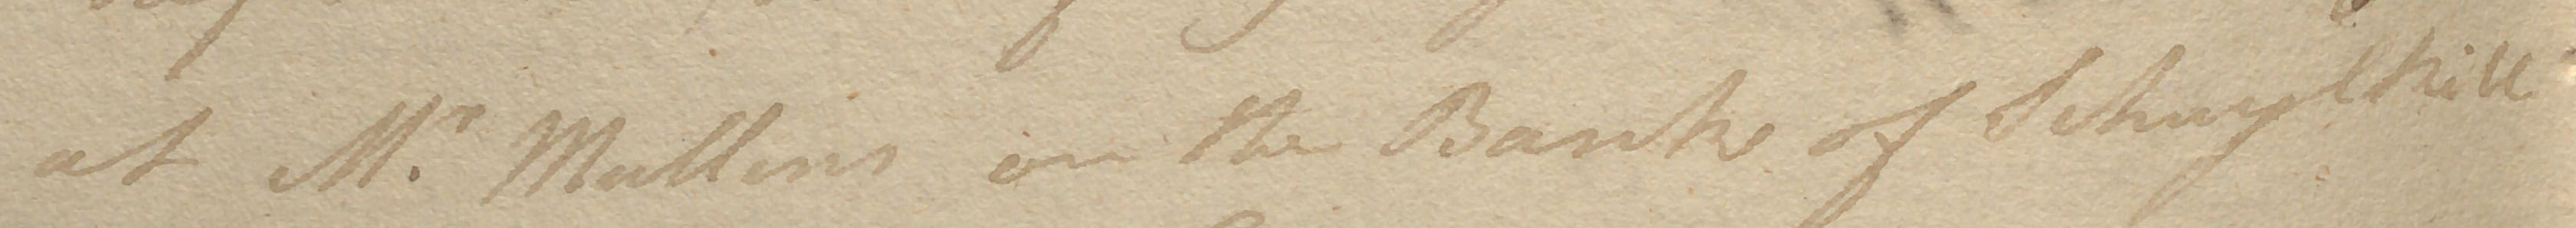at M^r. Mullins on the Bank of Schuylkill
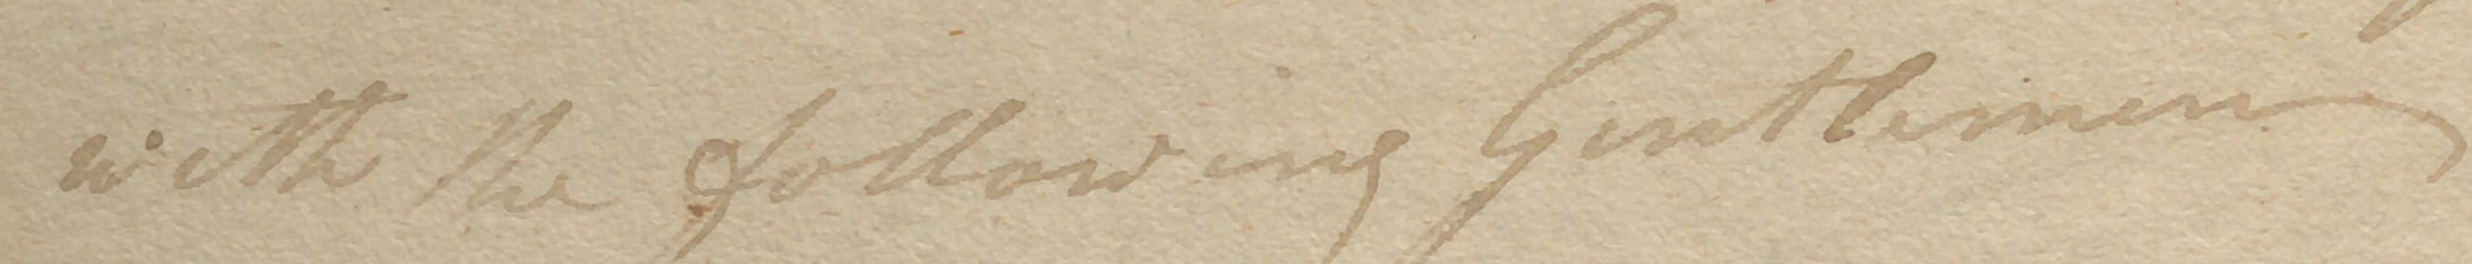with the following Gentlemen
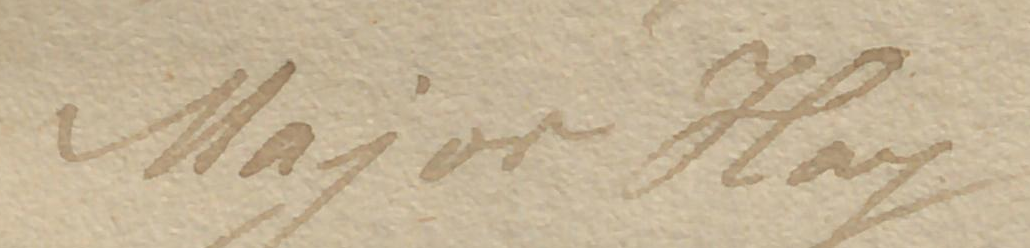Major Hay
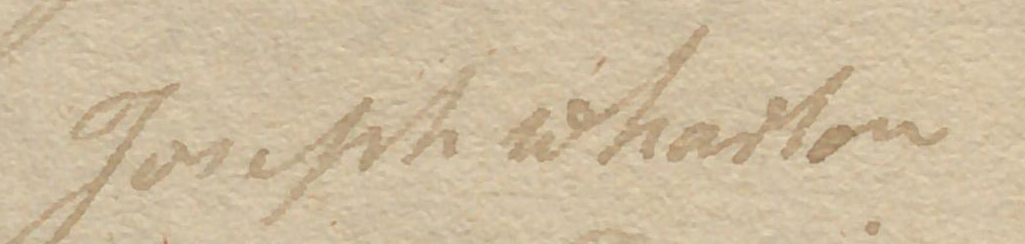Joseph wharton
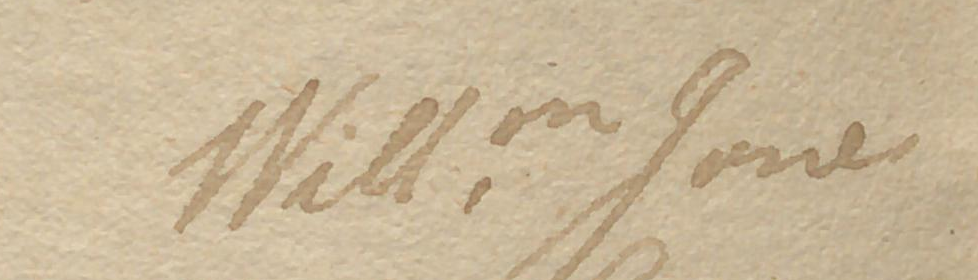Will^m. Jones
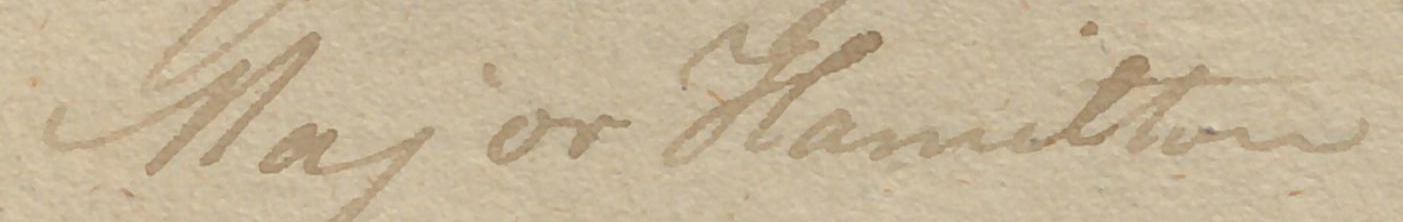Major Hamilton
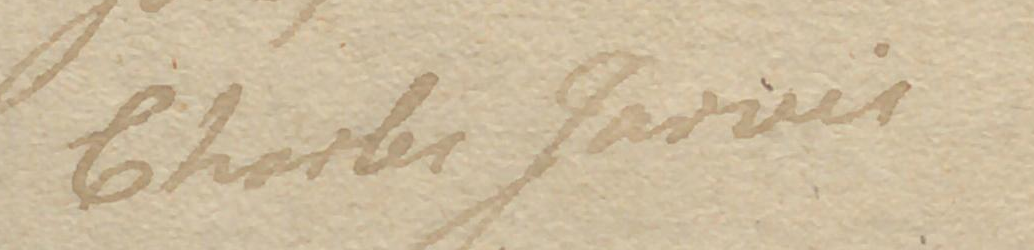Charles Jarvis
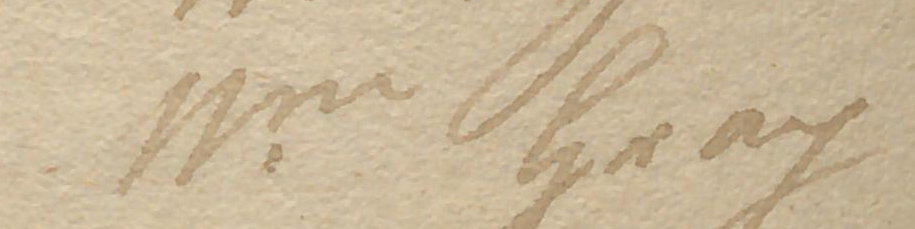W^m.Grray
